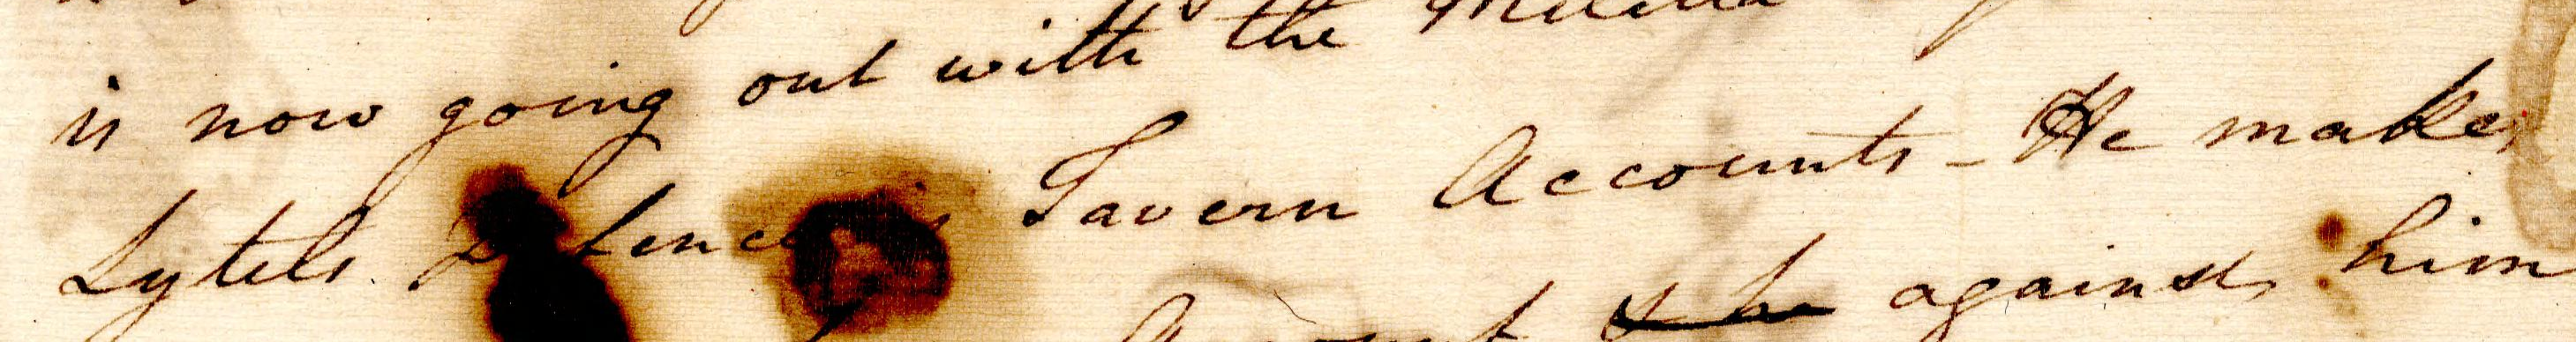Lytels D[_]fenc[___] Tavern Accounts- He makes
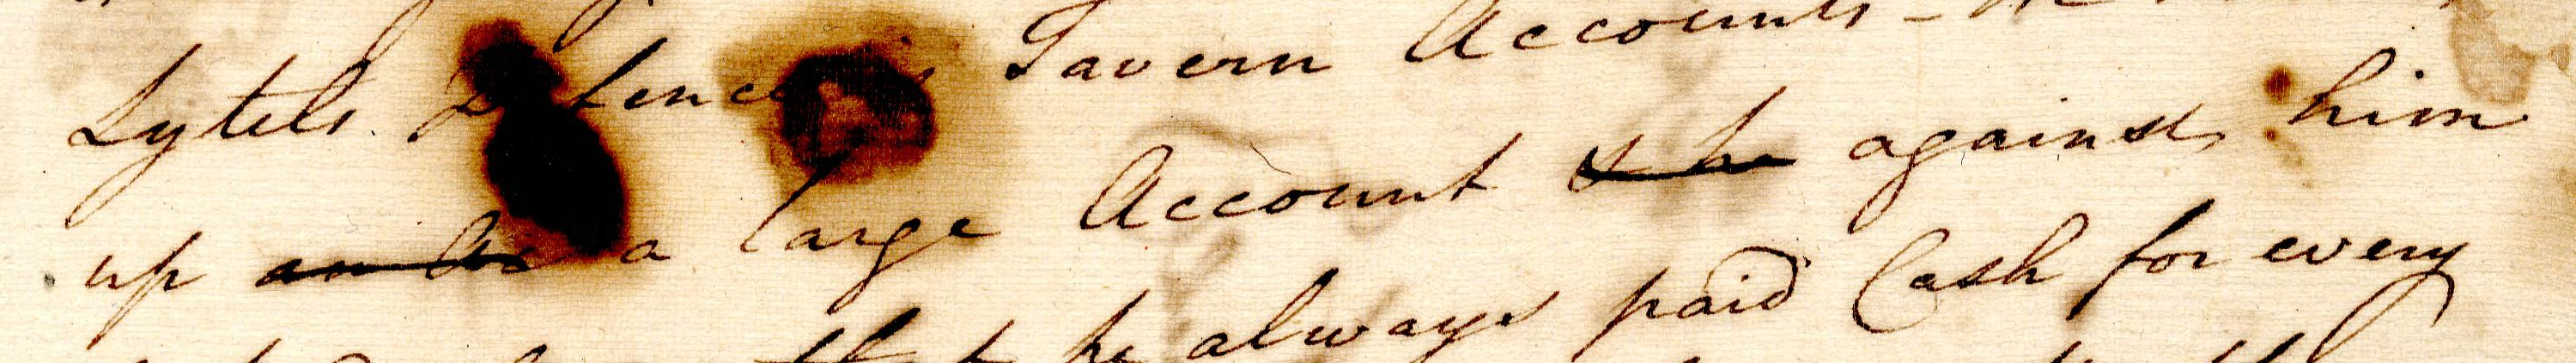up an Ac a large Account & he against him
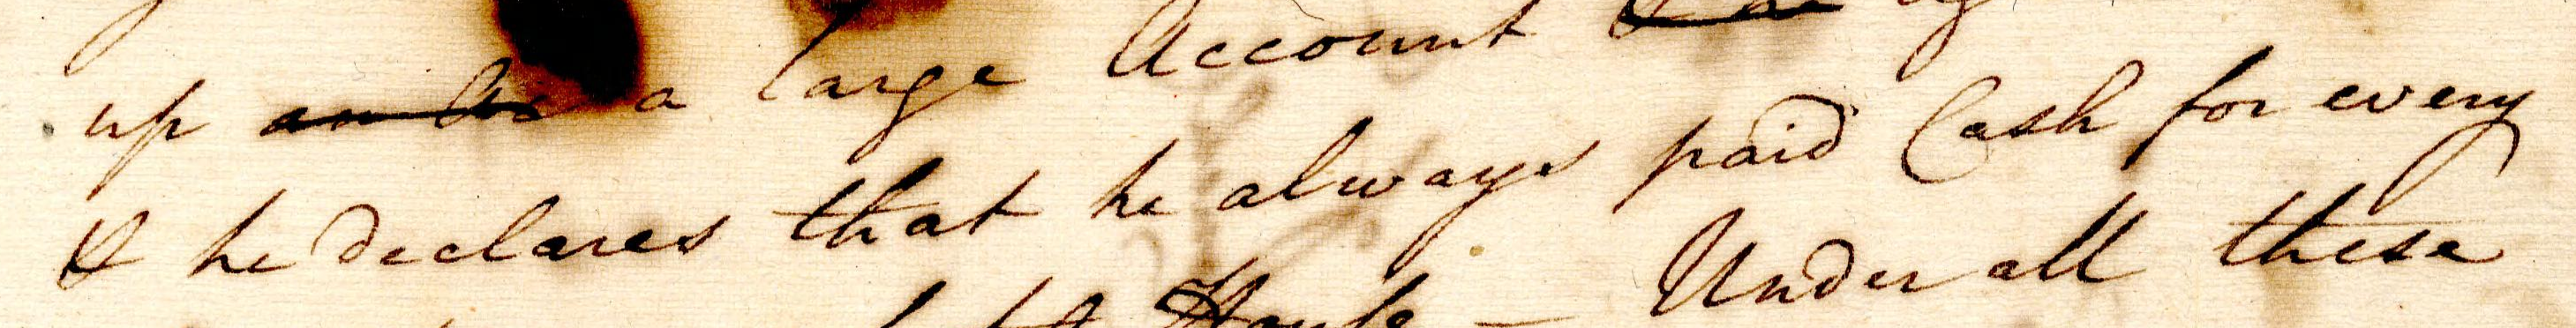& he declares that he always paid Cash for every
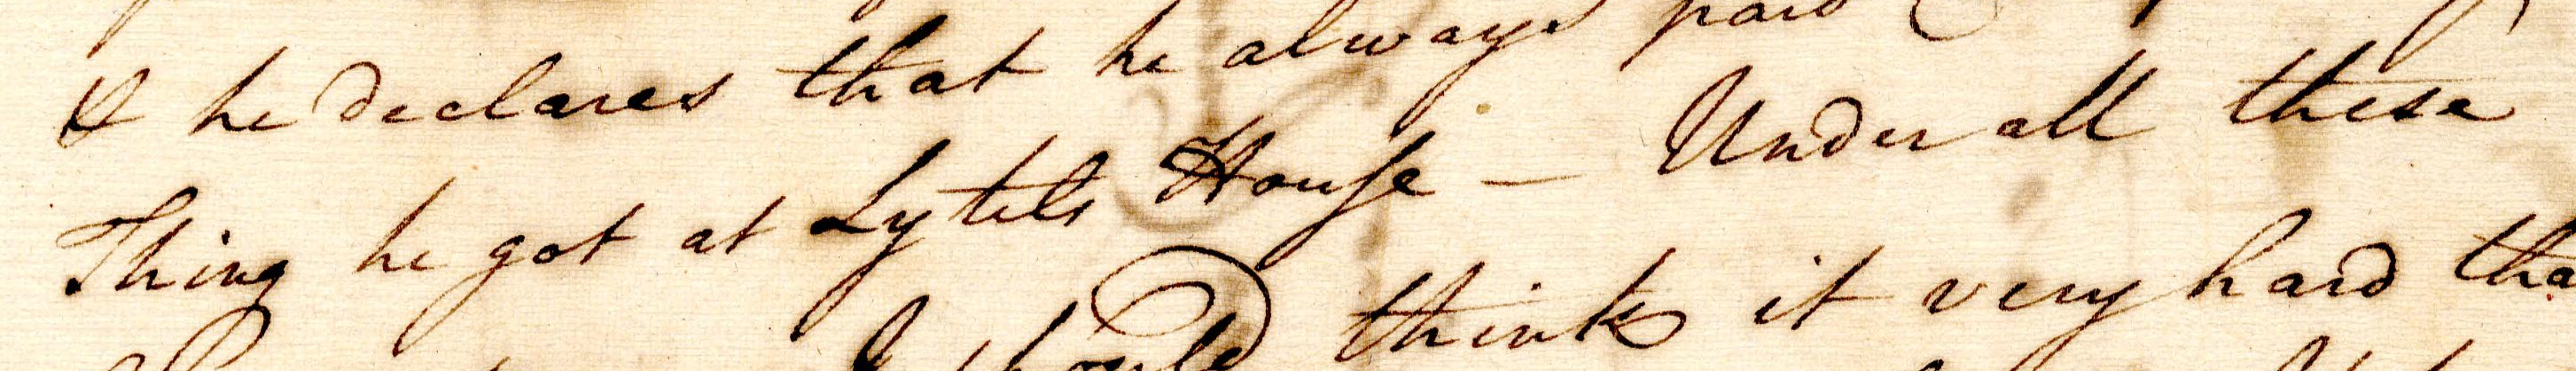Thing he got at Lytels House- Under all these
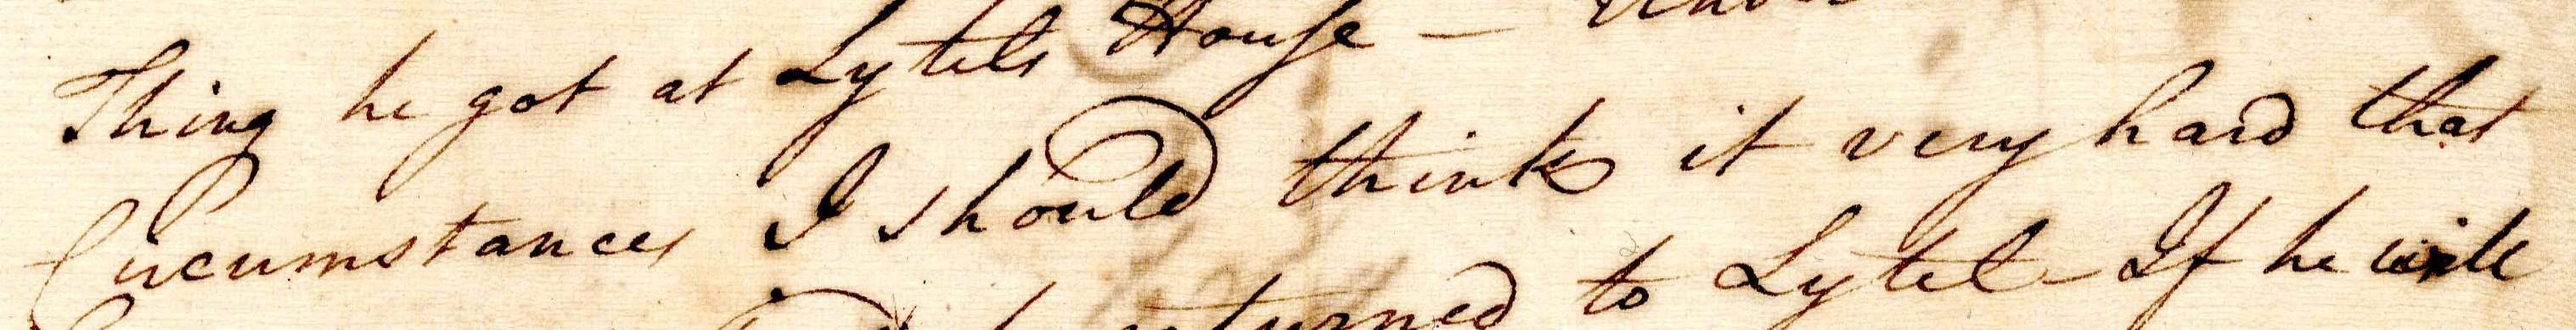Circumstances I should think it very hard that
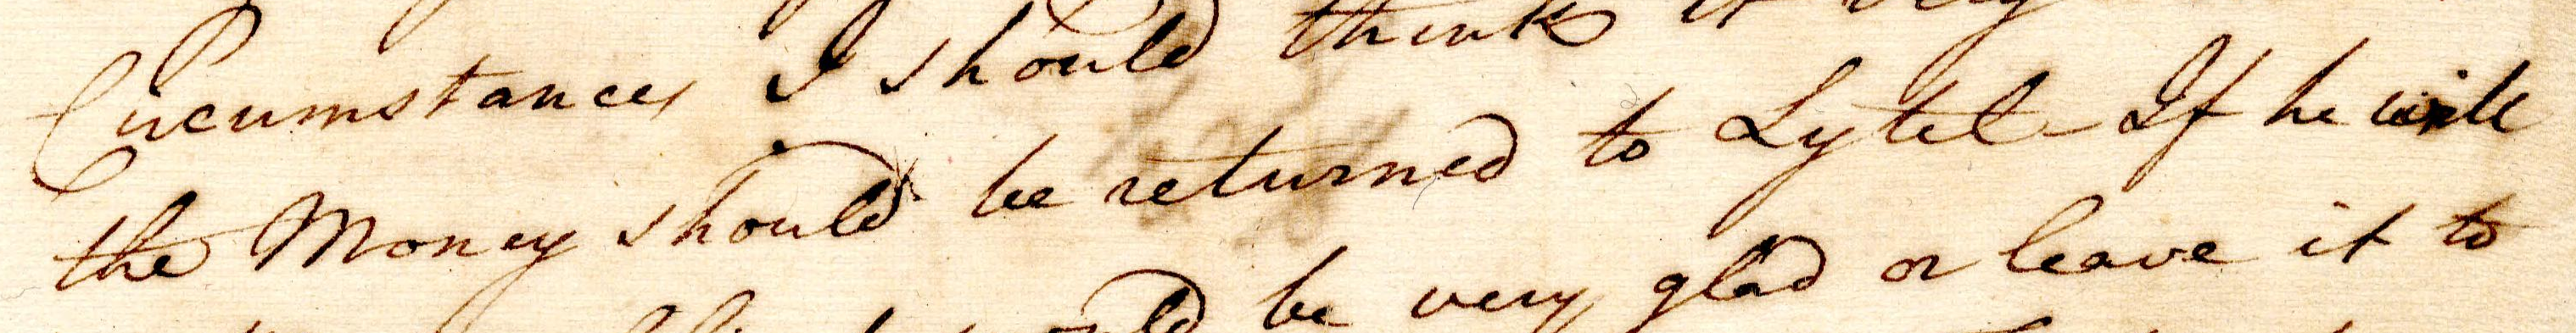the Money should be returned to Lytel- If he will
